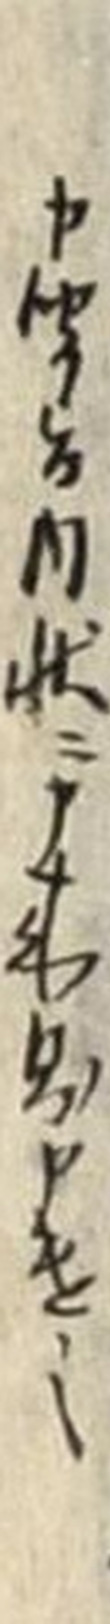申聞候旨内状に申来則申遣之
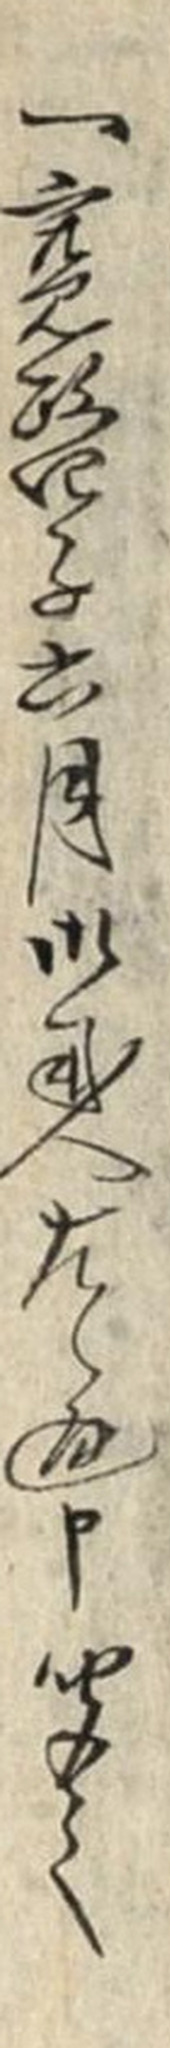一寛政四子六月御用人左之通申聞之
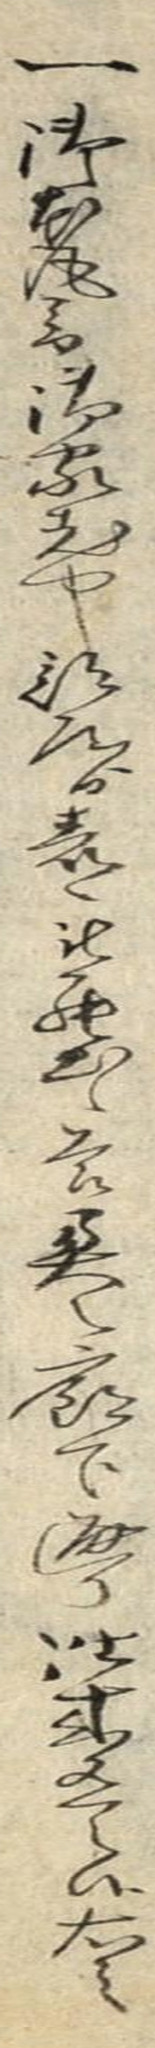一御本丸に而御家老中部屋ゟ表へ被罷出候節奥之廊下通り往来有之候右之
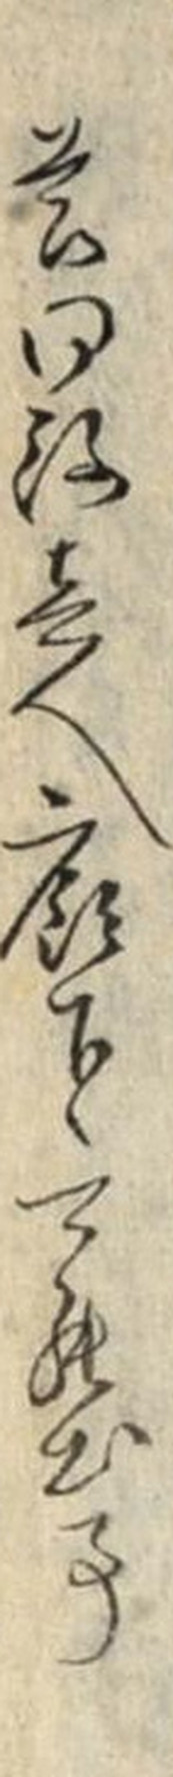節同役壱人廊下へ可罷出事
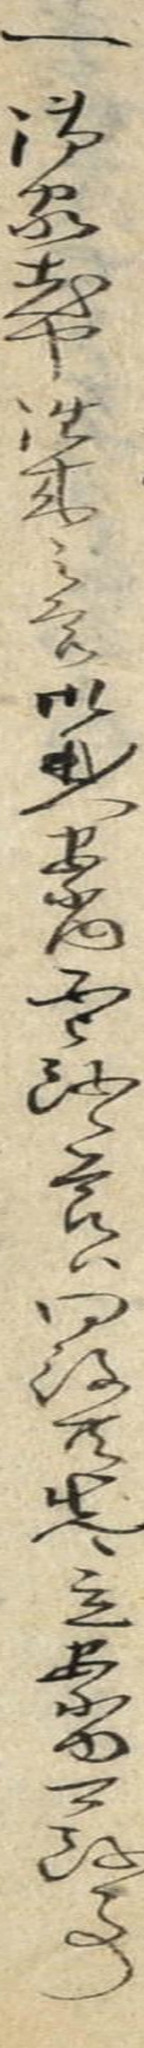一御家老中往来之節御用人案内不被致候節は同役共先へ立案内可致事
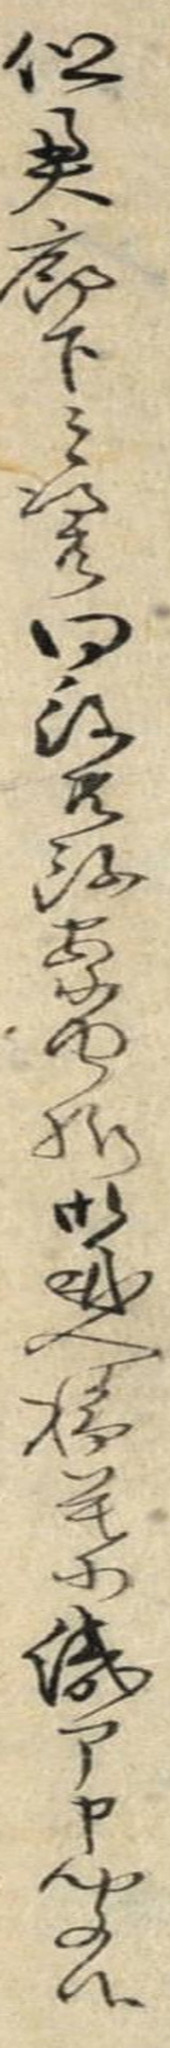但奥廊下に候へ共同役共致案内候様御用人稻葉織部申聞候

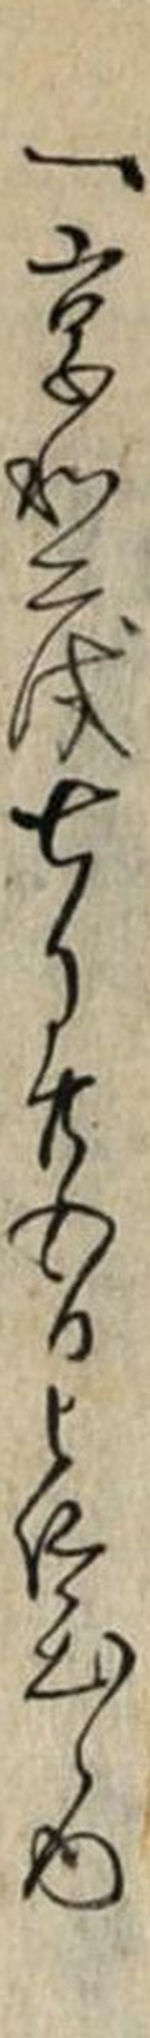一享和二戌七月廿五日被仰出候内
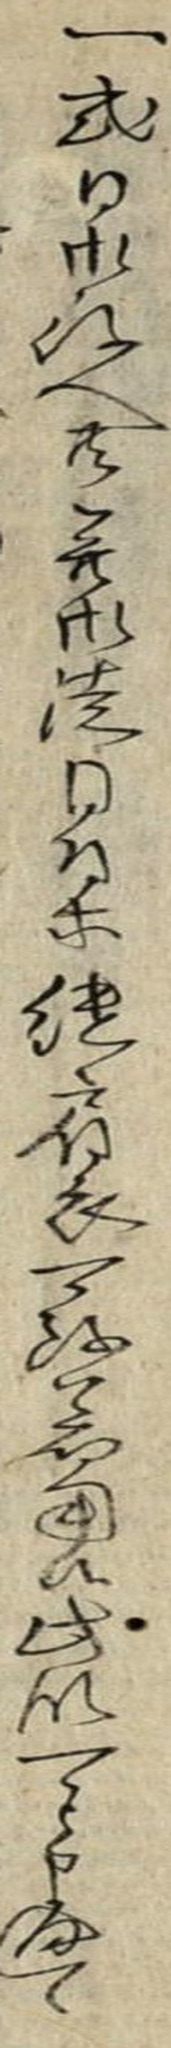一式日御役人共并御徒目付等継肩衣可致着用候此段可被申通候
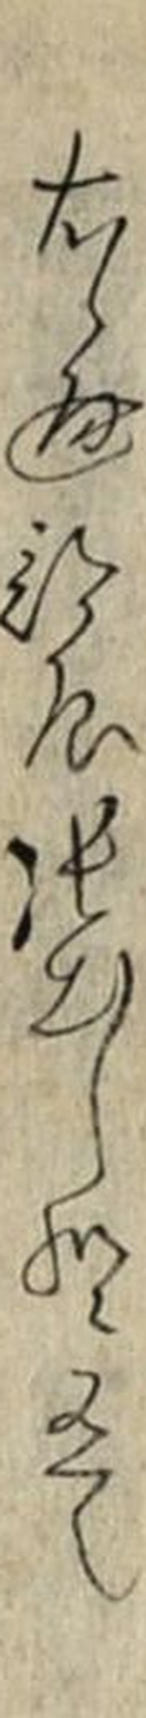右之通部屋張出之扣に有之
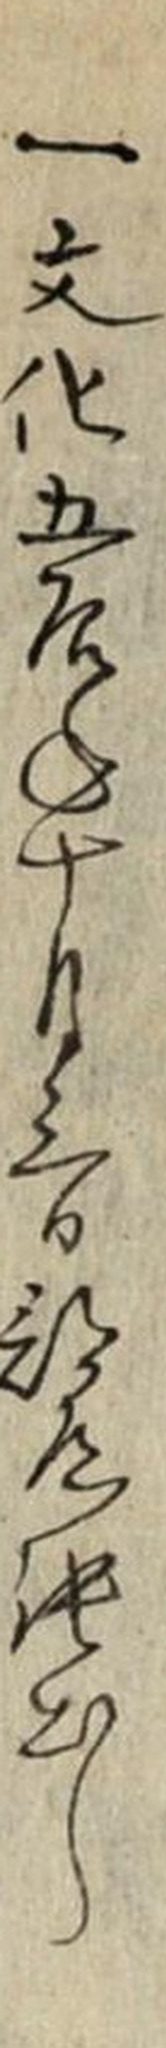一文化五辰年十月三日部屋張出し
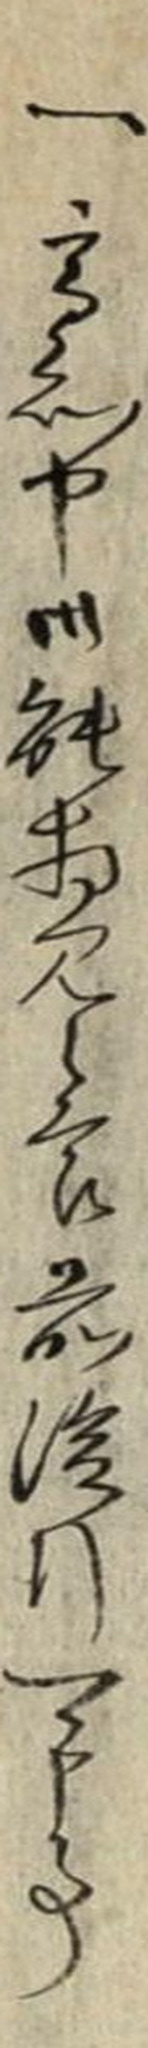一高知中御能拝見之節前後引申可申事
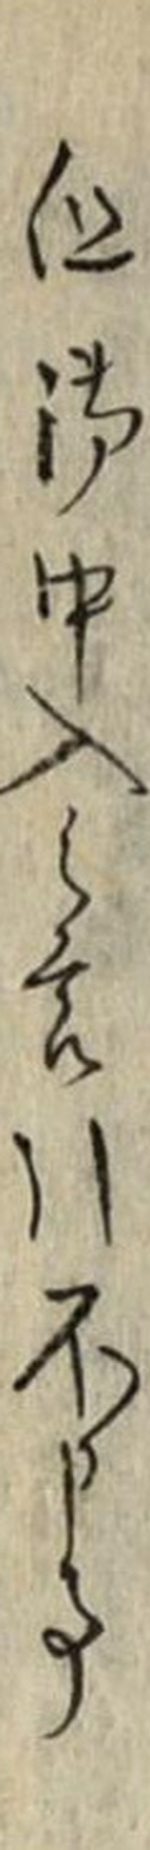但御中入之節引不申事
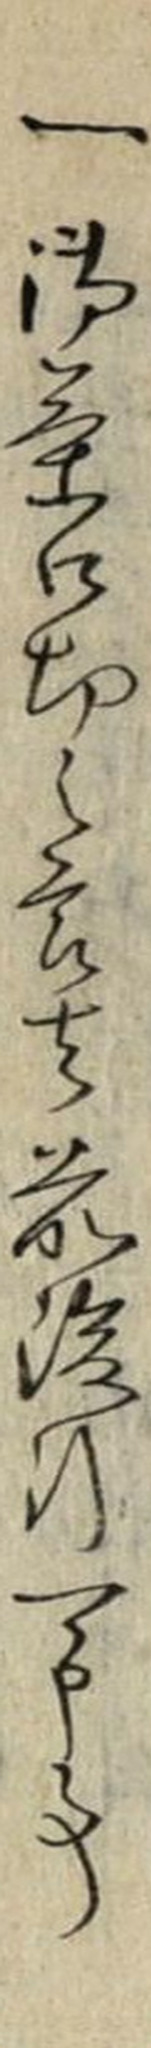一御茶口切之節は前後引可申事
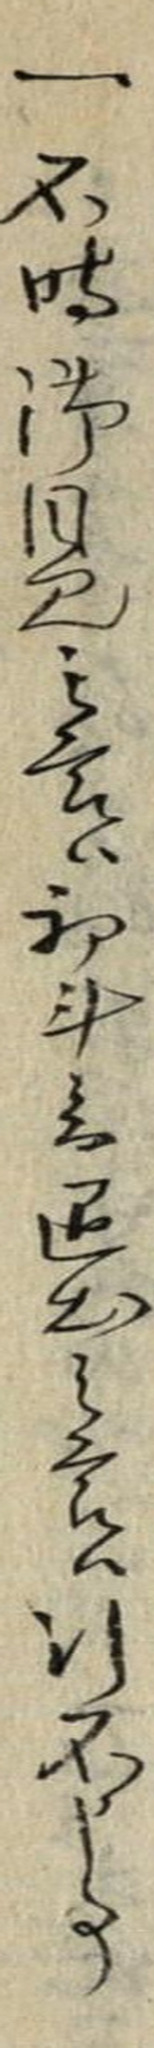一不時御目見之節は初斗に而退出之節は引不申事
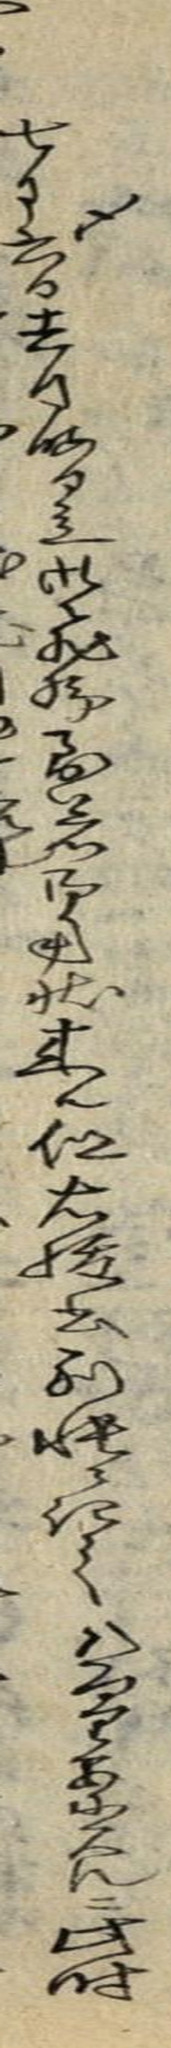七月六日去月晦日立御飛脚到着御用状来る但右抜書別帳に記之
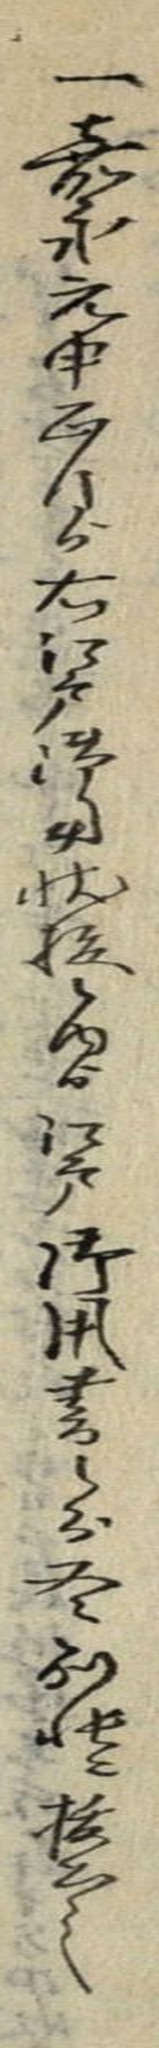一嘉永元申正月ゟ右江戸御用状抜候内ゟ江戸御用書之分又々別帳に抜出之
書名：蒐輯之部
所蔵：福井県文書館 Fukui Prefectural Archives
